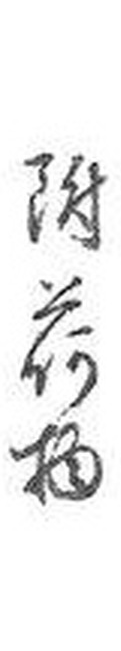附荷物
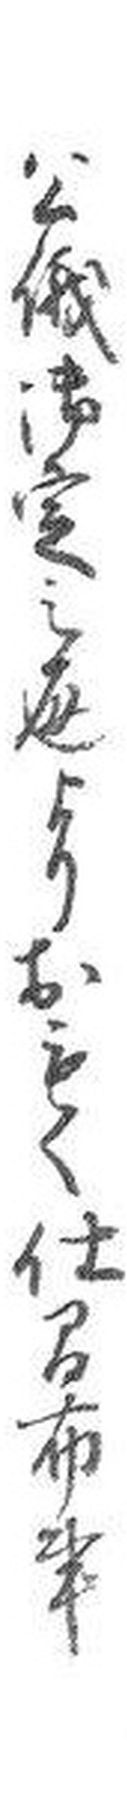公儀御定之通よりおもく仕間布事
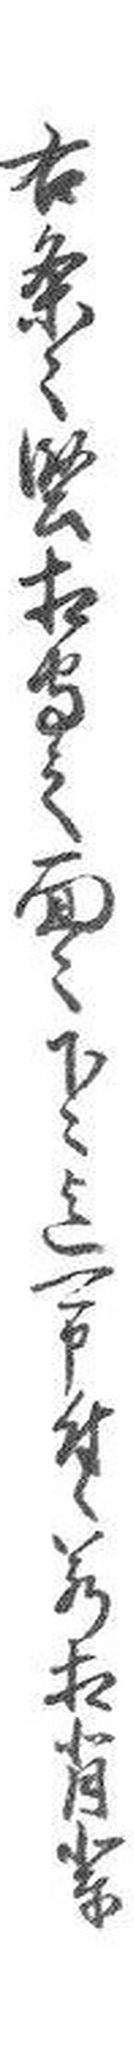右条々堅相守之面々下々迄可申付候若相背輩
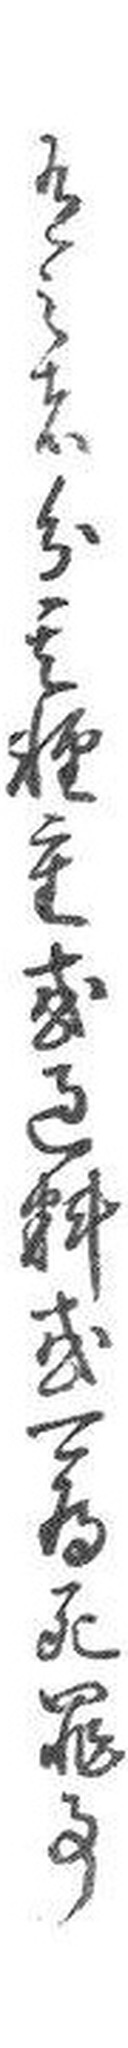有之者分其軽重或過料或可為死罪事
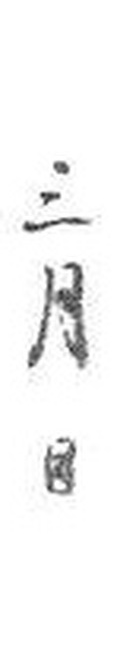三月日
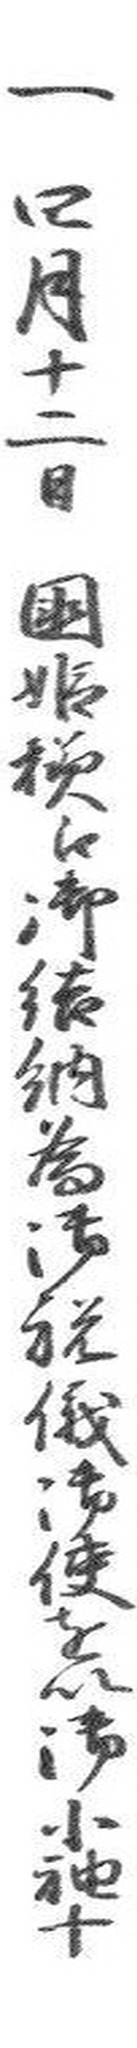一四月十二日国姫様江御結納為御祝儀御使を以御小袖十
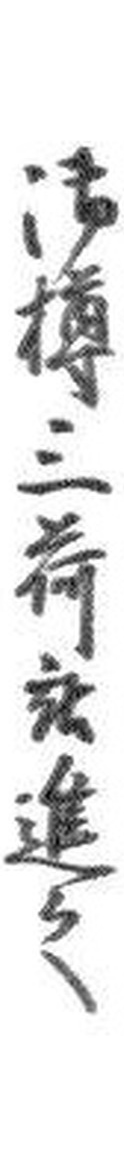御樽三荷被進之
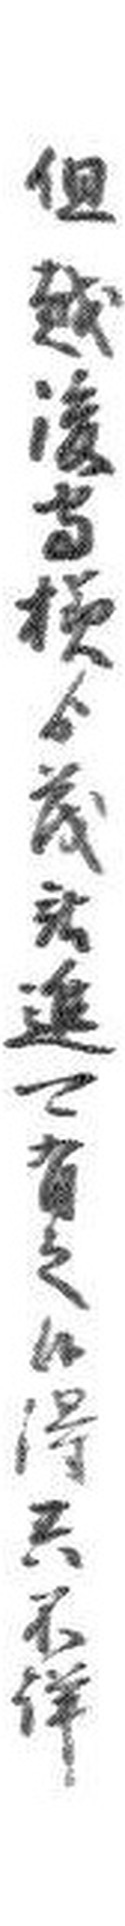但越後守様ゟ茂被進可有之候得共不詳

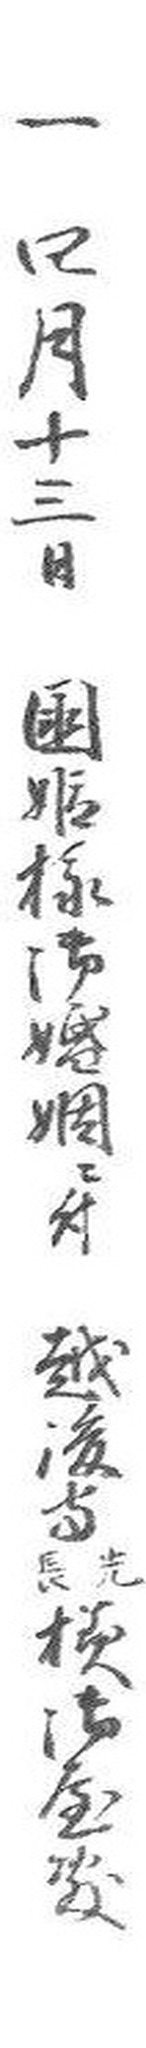一四月十三日国姫様御婚姻ニ付越後守光長様御屋敷
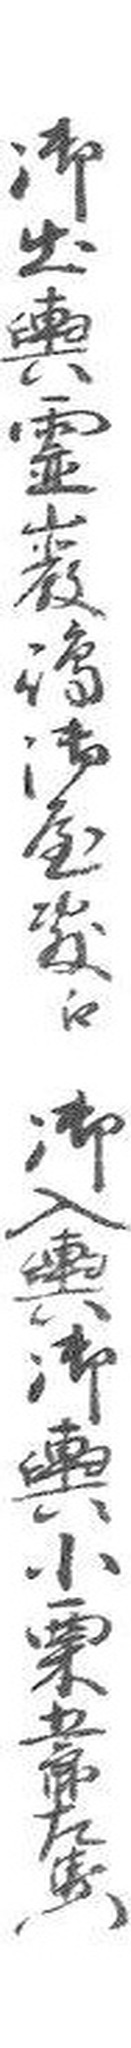御出輿霊巌島御屋敷江御入輿小栗五郎左衛門
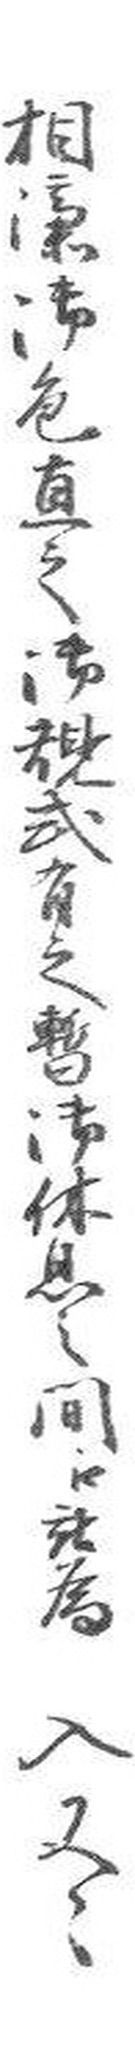相済御色直之御規式有之暫御休息之間江被為入又々
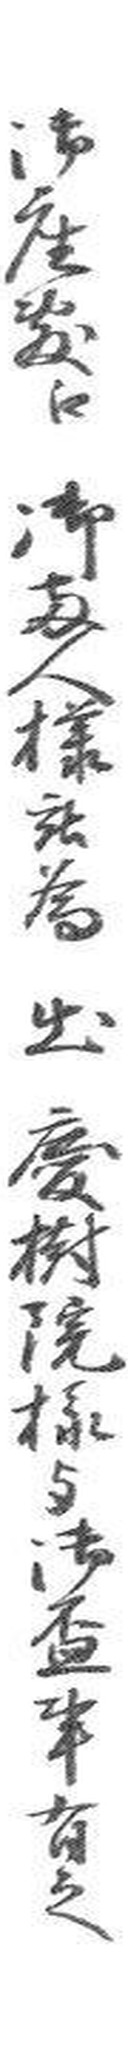御座敷江御両人様被為出慶寿院様と御盃事有之
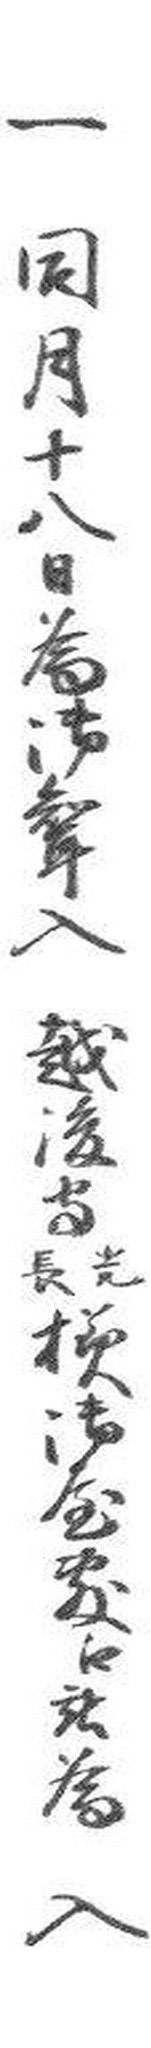一同月十八日為御婿入越後守光長様御屋敷江被為入
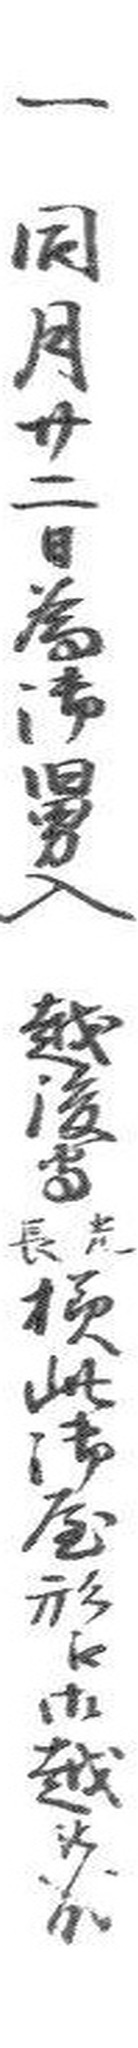一同月廿二日為御舅入越後守光長様此御屋形江御越被成
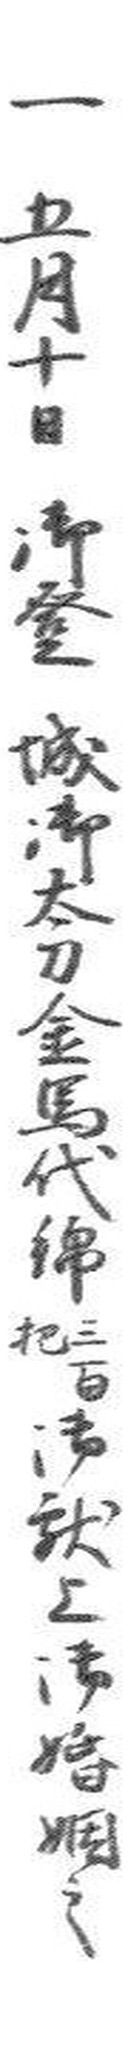一五月十日御登城御太刀金馬代綿三百把御献上御婚姻之
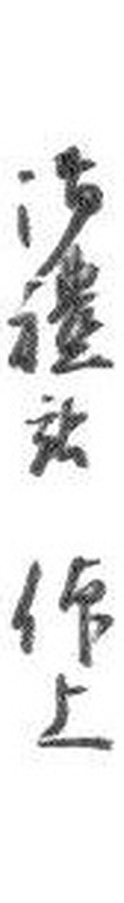御礼被仰上
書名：家譜 五 光通公 従寛永十三年到万治二年
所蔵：福井県文書館 Fukui Prefectural Archives
